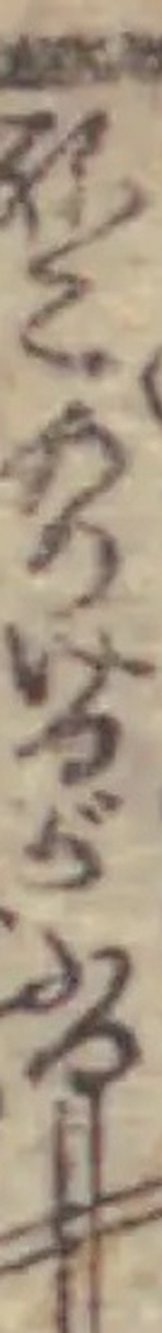ねこありけるがふる
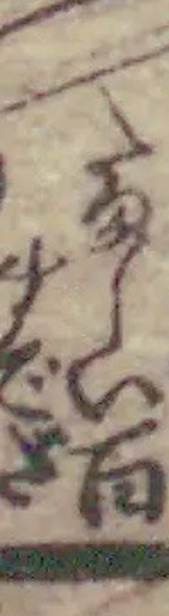たましい百
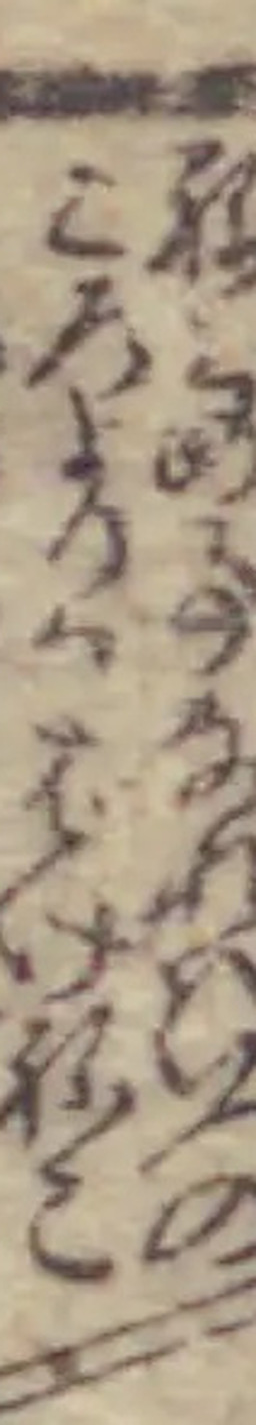ころよりかばけねこ
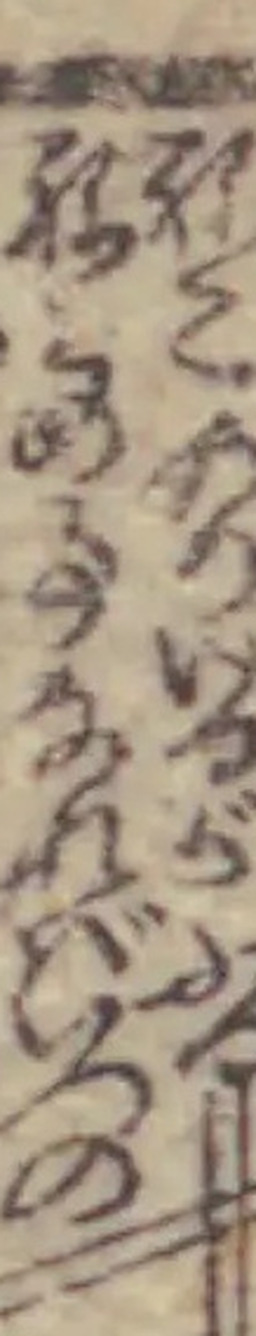ねこの事なればいつの
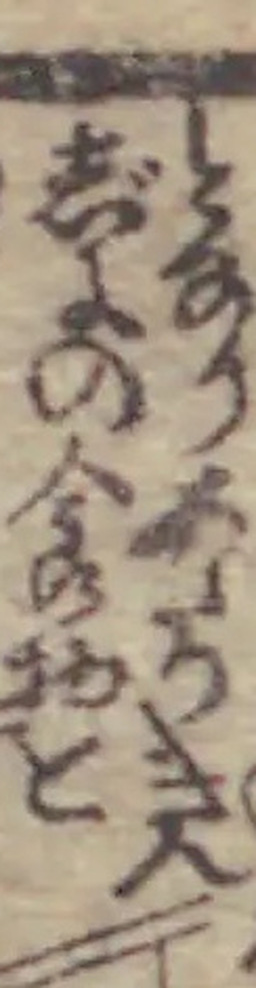じよの食物を
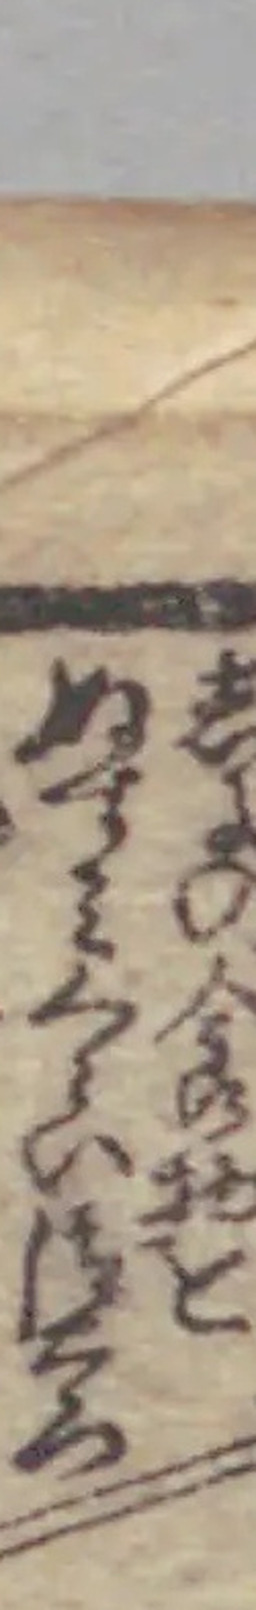ぬすみくらい清右エ門
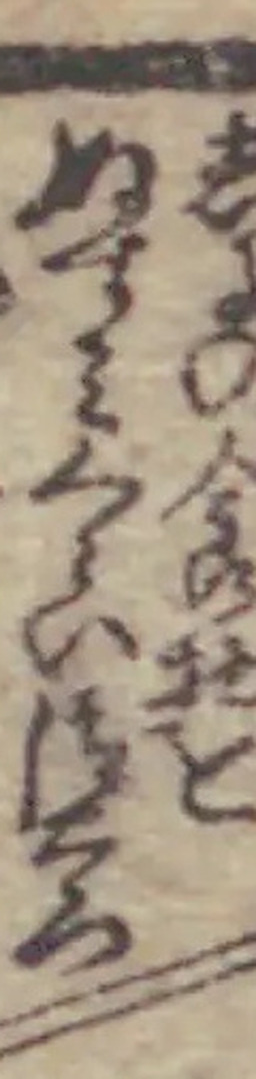ぬすみくらい清右エ門
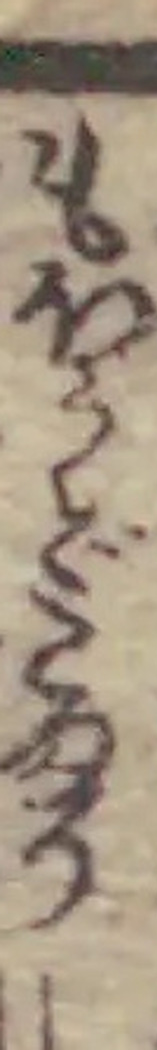もほうどこまり
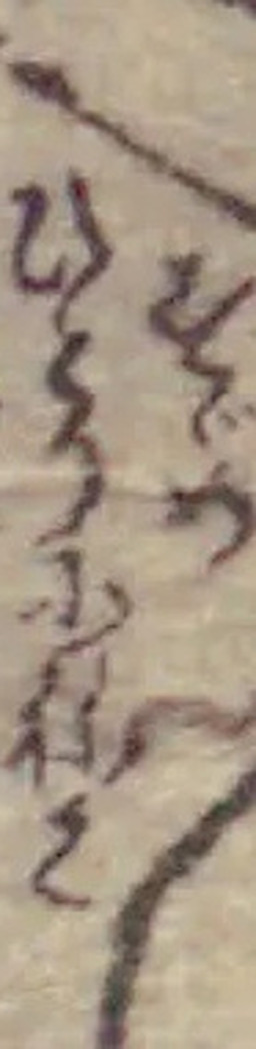ひとりにねこ
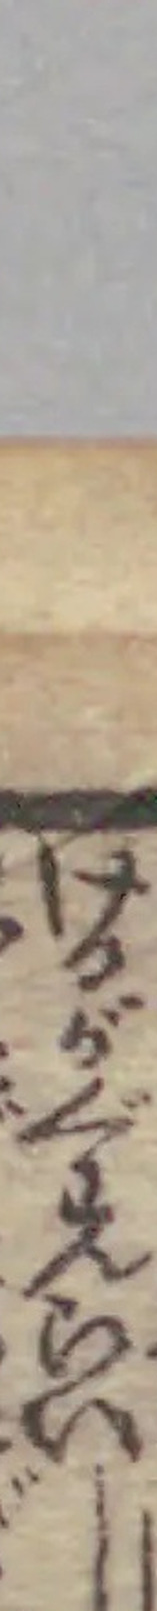けるがぐわんらい
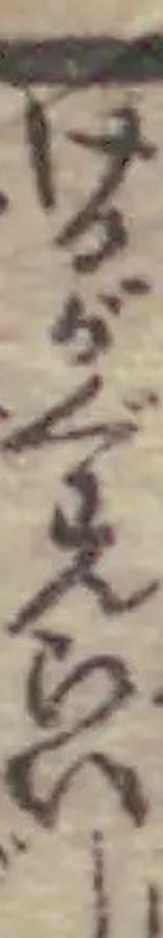けるがぐわんらい
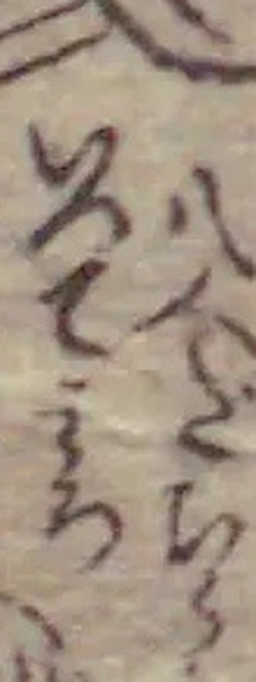いつてみろ
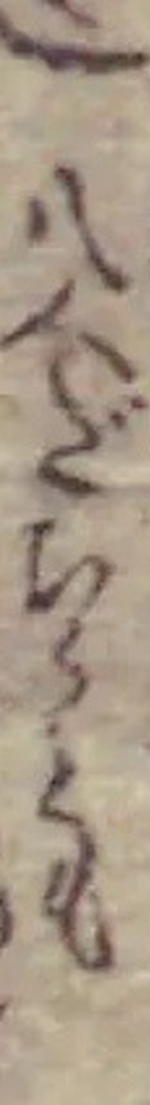八人だちらとも
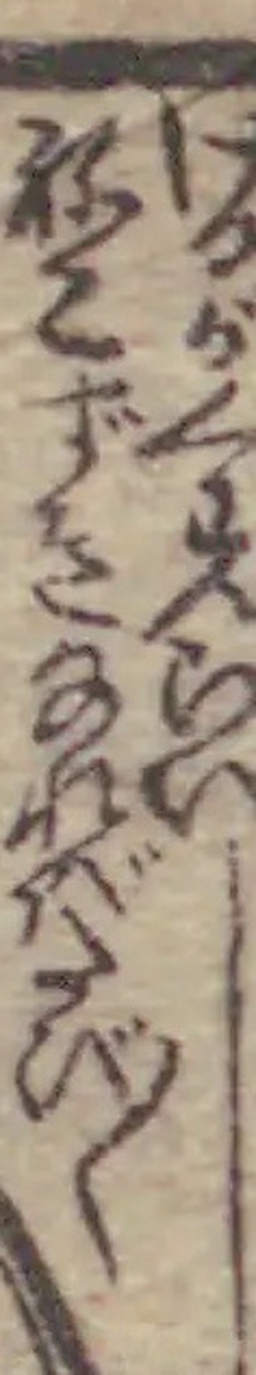ねこずきなればたび〳〵
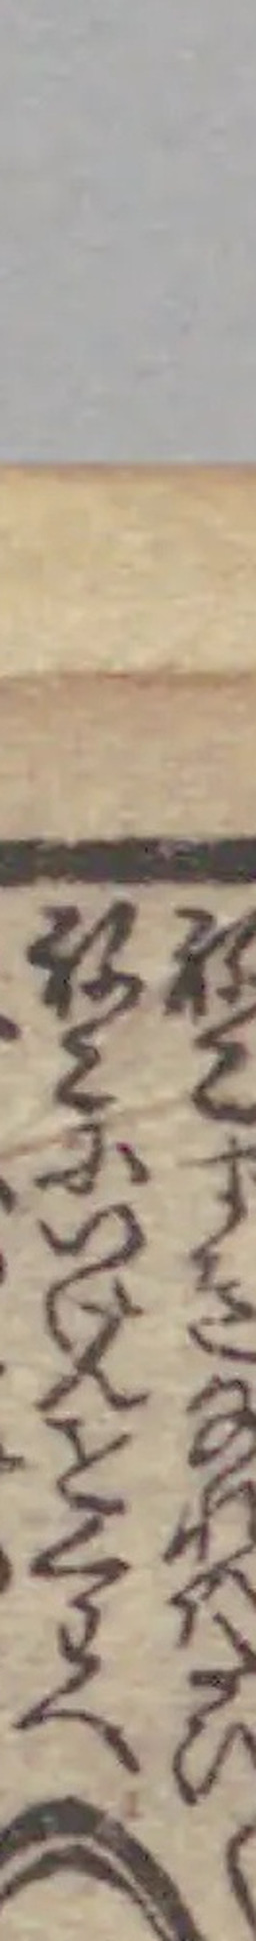ねこにいけんをくわへ
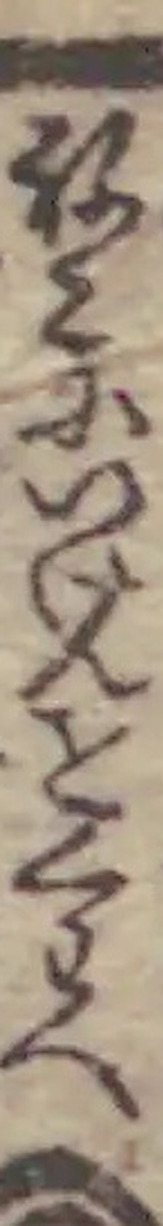ねこにいけんをくわへ
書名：冷水灰毛猫 2巻
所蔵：国立国会図書館 National Diet Library, JAPAN
